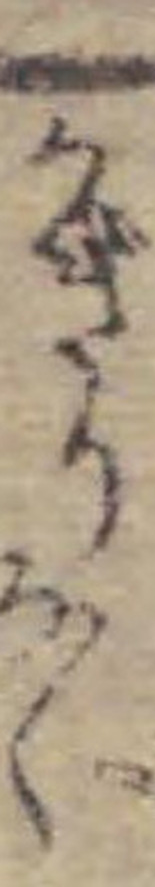かぎりなく
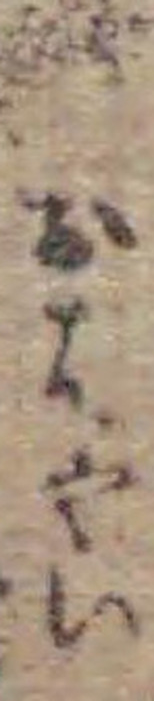おはやい
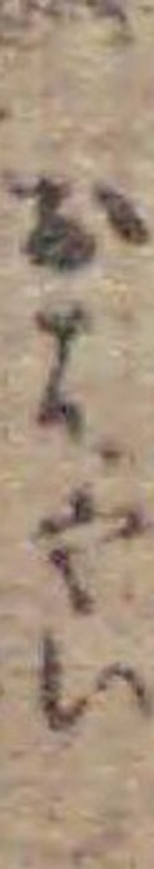おはやい
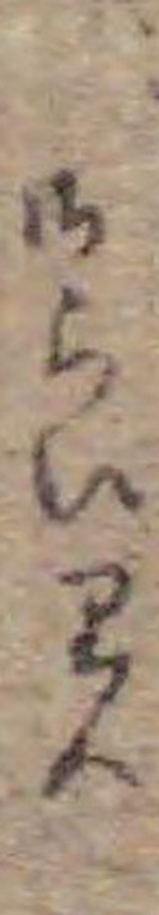御らいりん
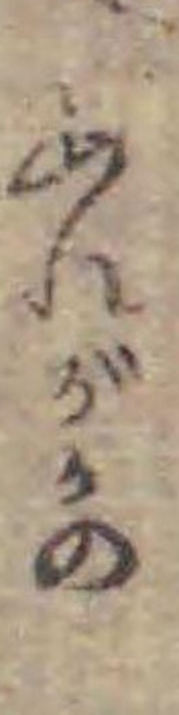あれがかの
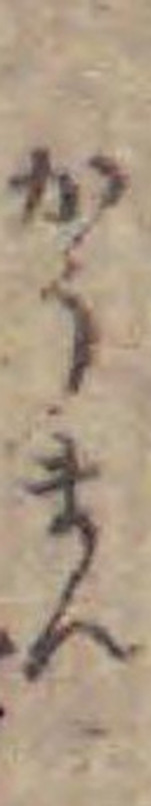かうまん
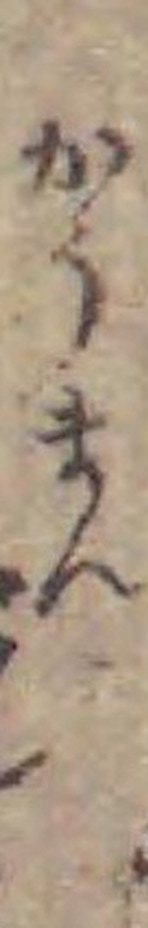かうまん
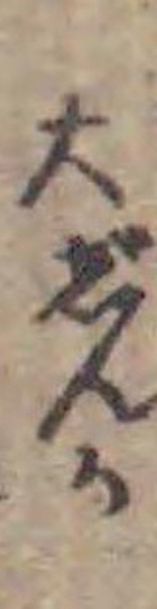大じんか
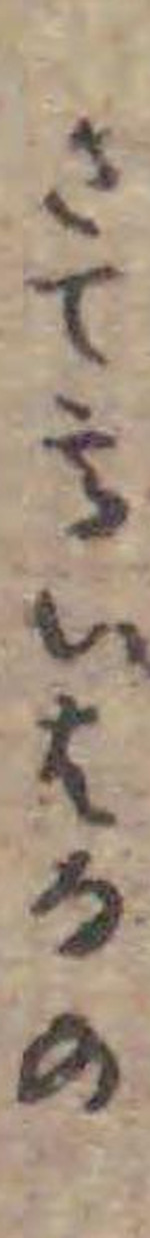さて高いはなの

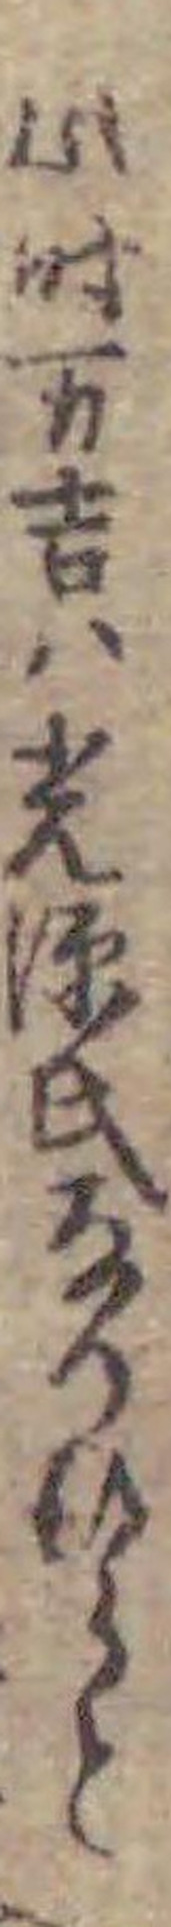此時万吉は光源氏なりひらと
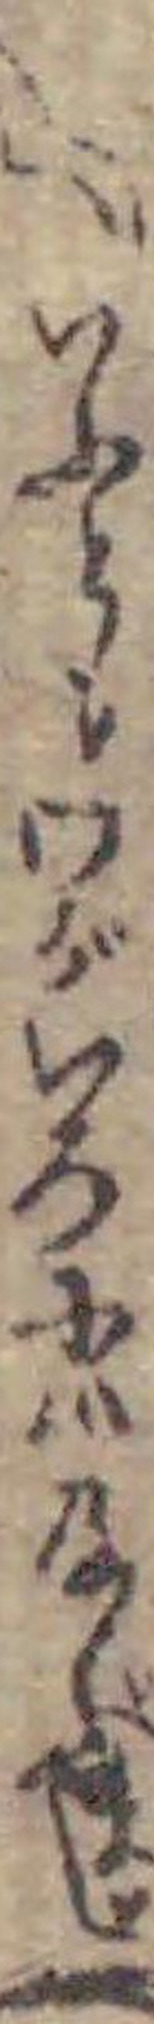いふともわがいろに及ぶまじ
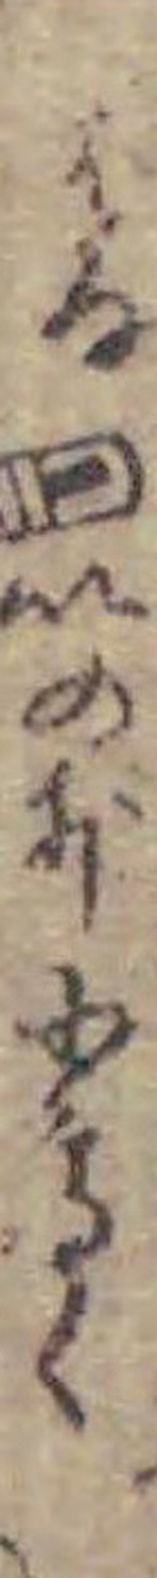はないの外に高く
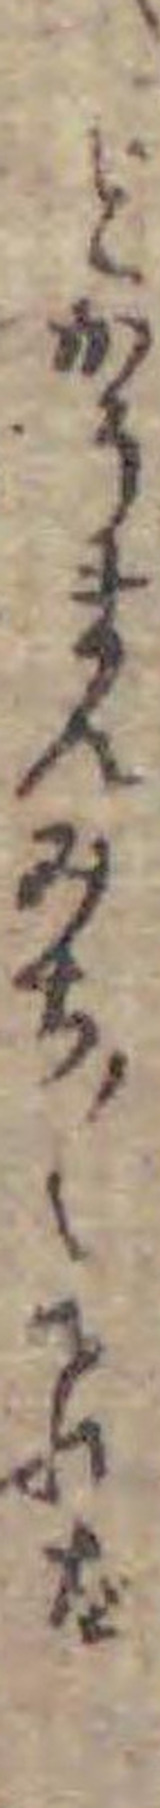とかうまんみち〳〵ければ
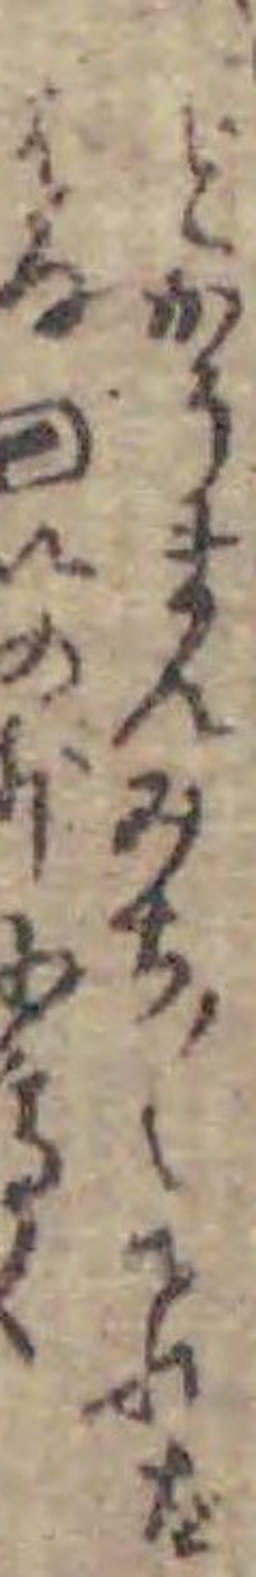はないの外に高く
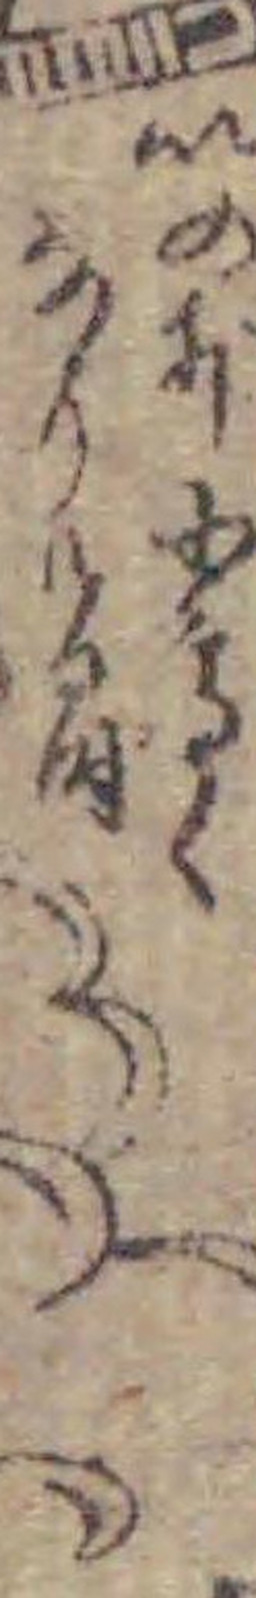なりける時
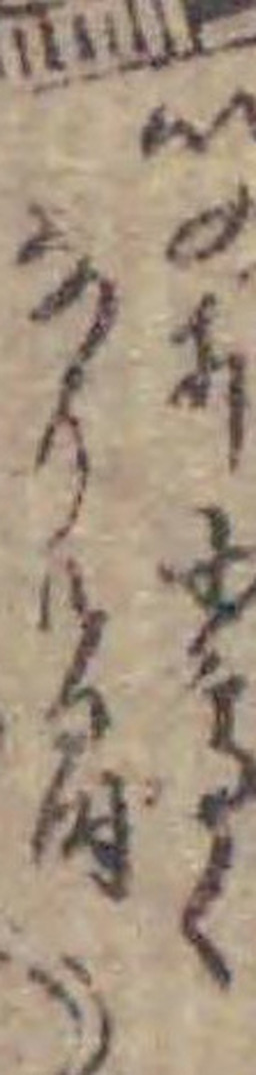なりける時
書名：鼻峰高慢男 : 2巻
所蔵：国立国会図書館 National Diet Library, JAPAN
